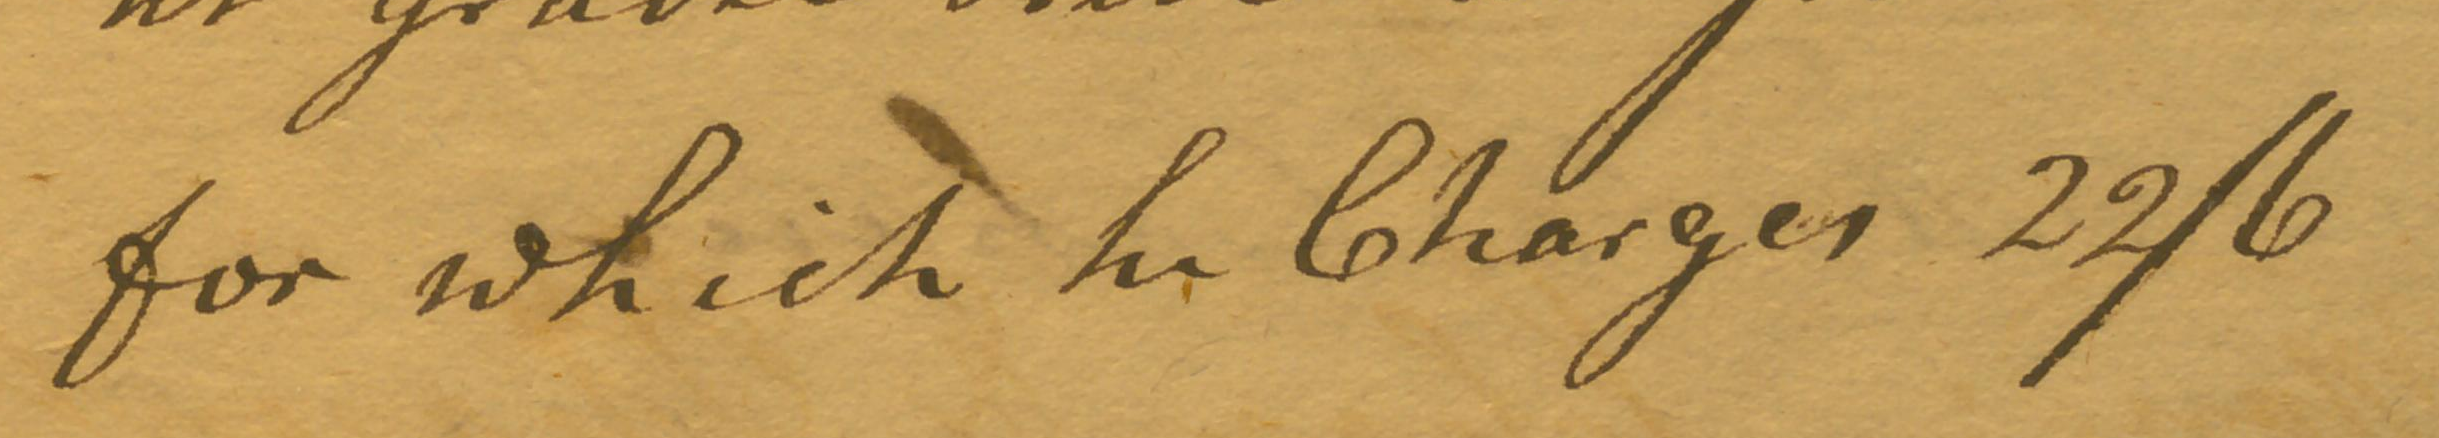for which he Charges 22s6
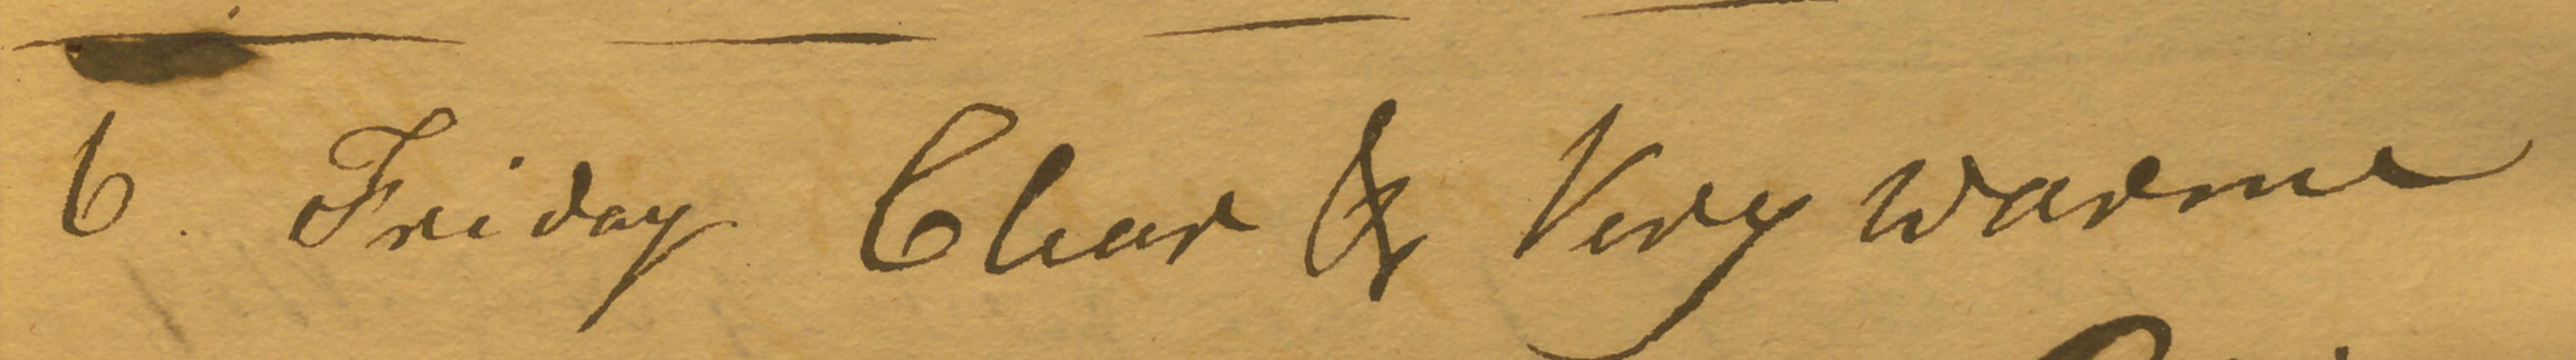6 Friday Clear & Very warme
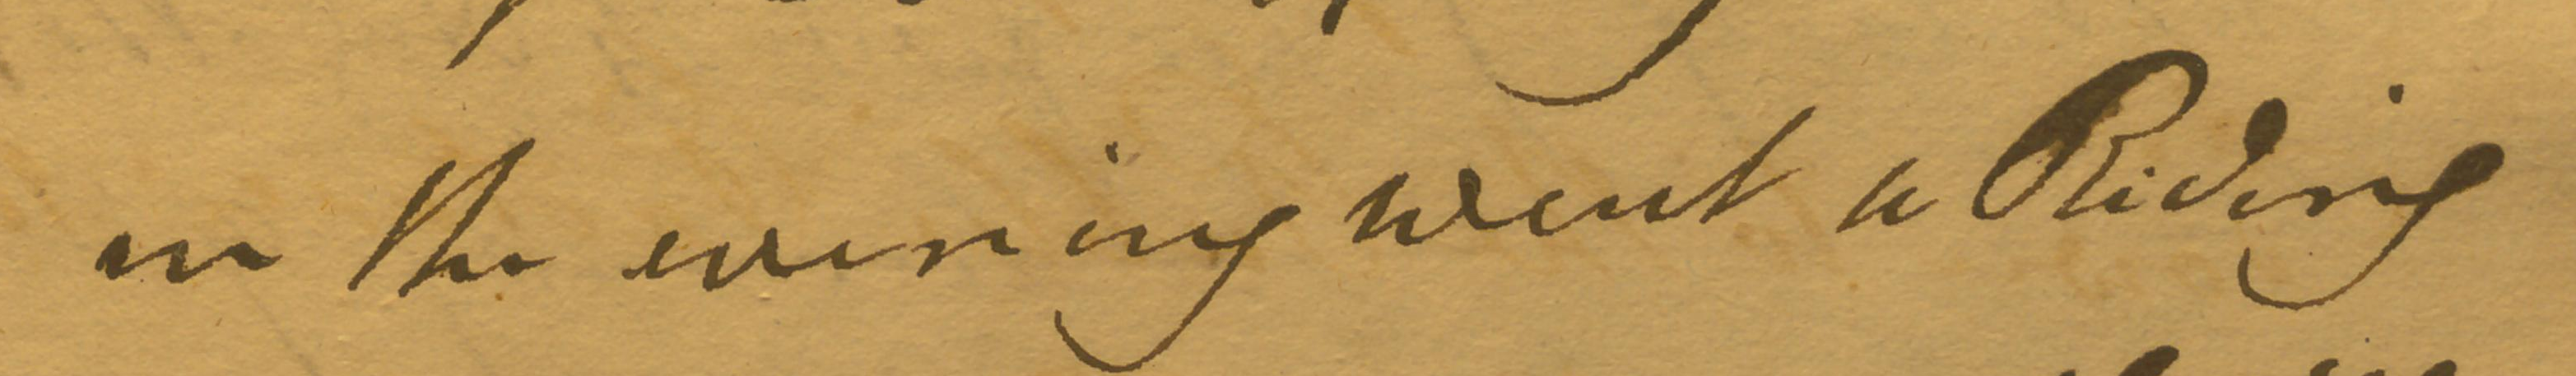in the evening went a Riding
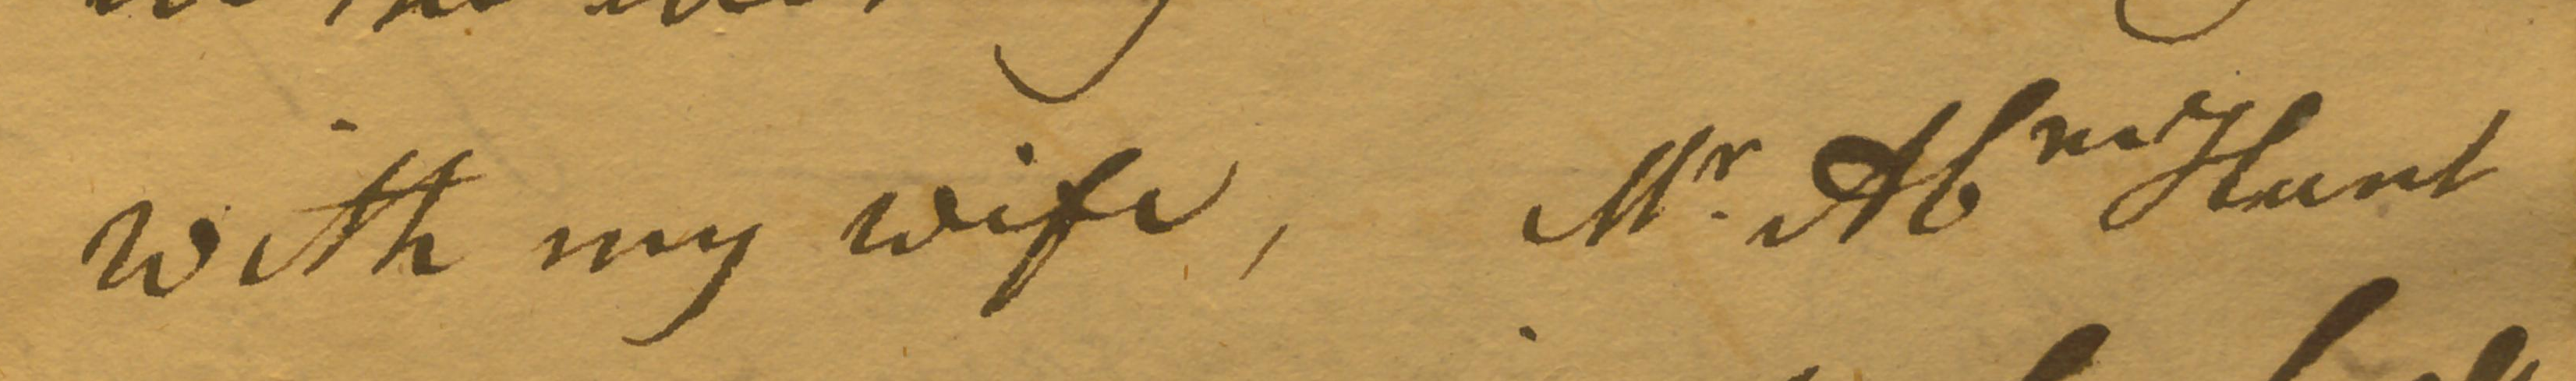with my wife, M^r. Ab^m Hunt
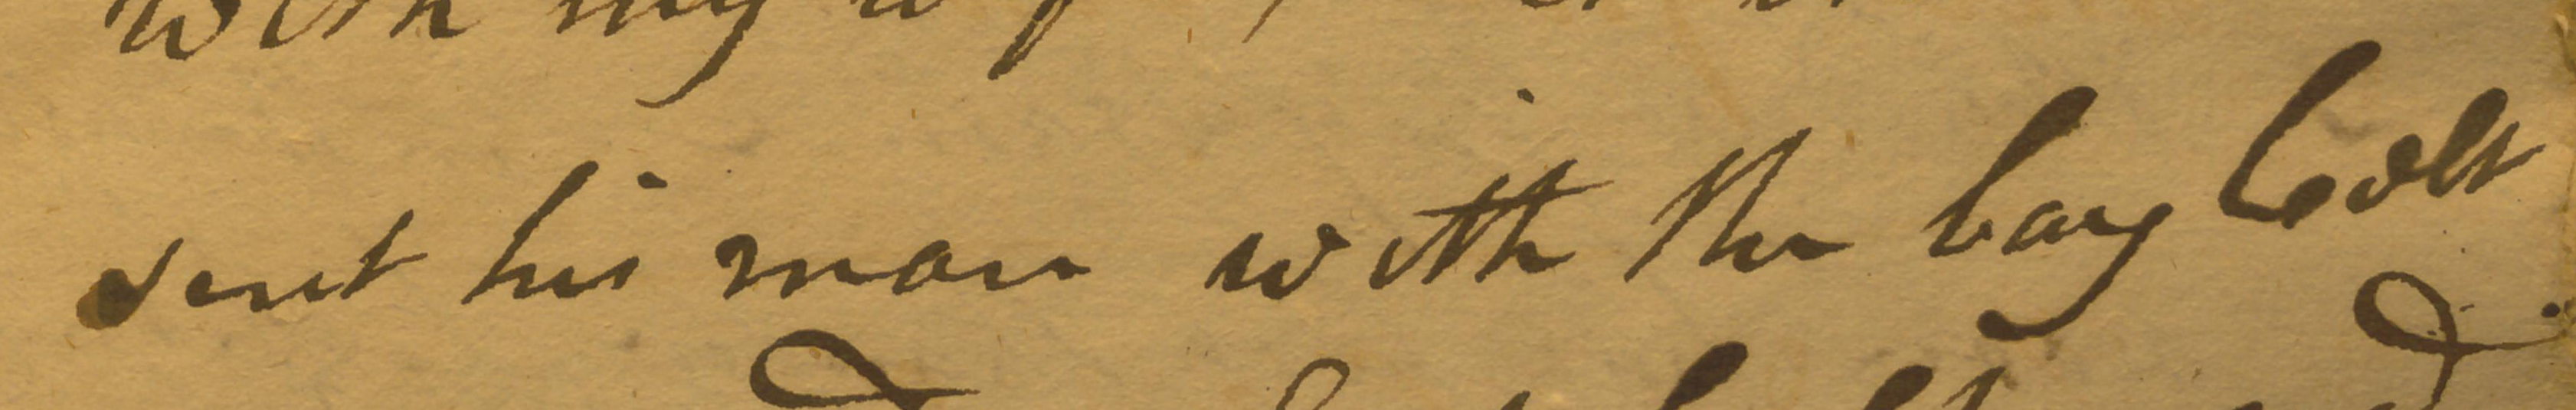sent his man with the bay Colt
